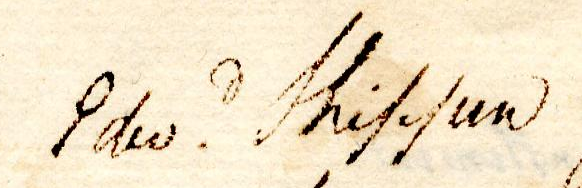Edw^d. Shippen
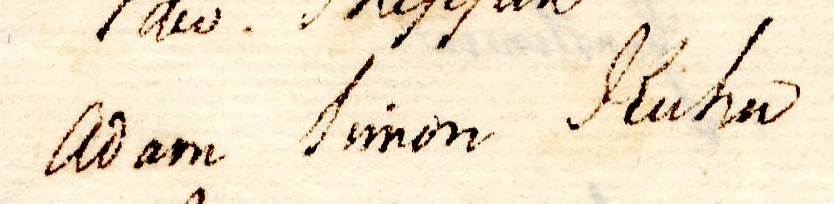Adam Simon Kuhn
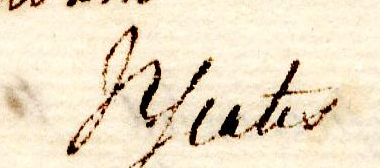JYeates
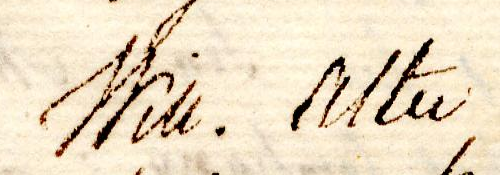Will. Attee
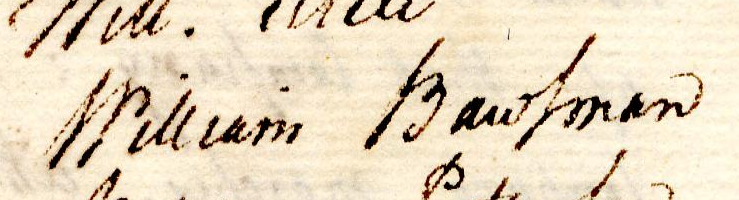William Bawsman
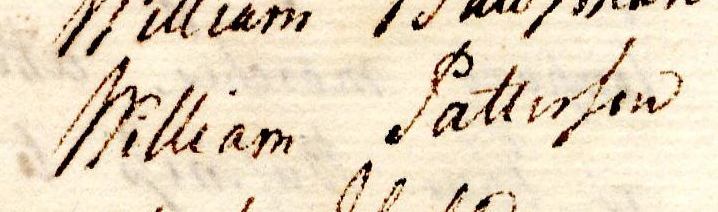William Patterson
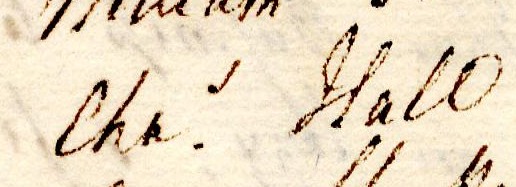Cha^s. Hall
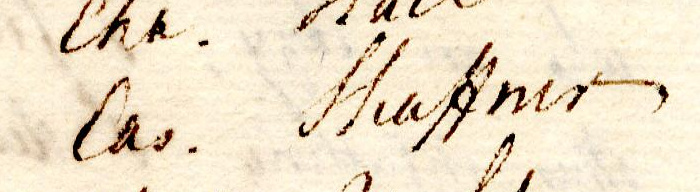Cas. Shaffner
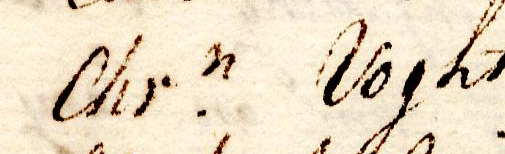Chr^n. Voght
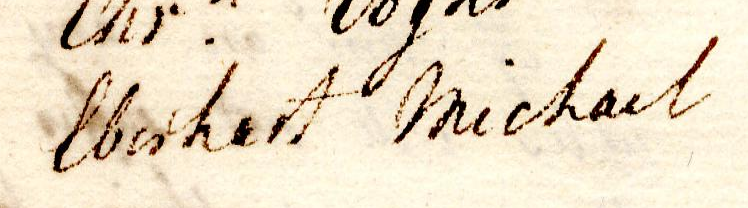Eberhart Michael
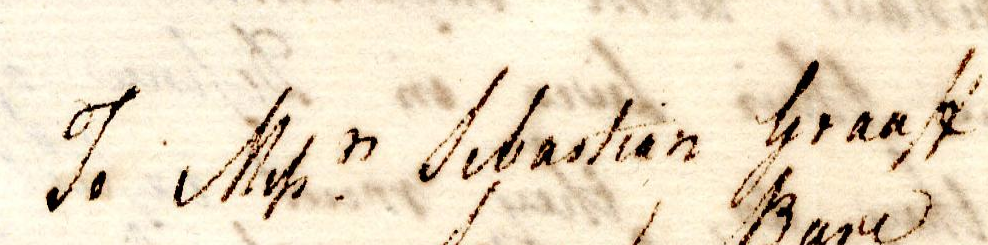To Mess^r. Sebastien Graaff
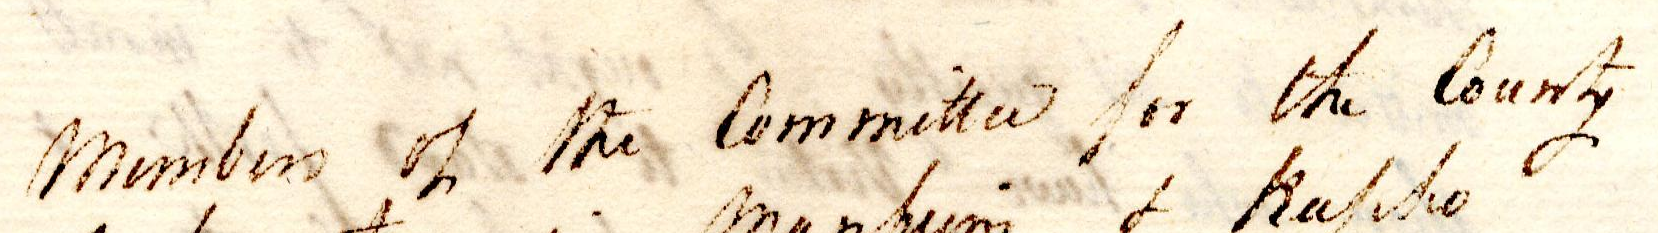Members of the Committee for the County
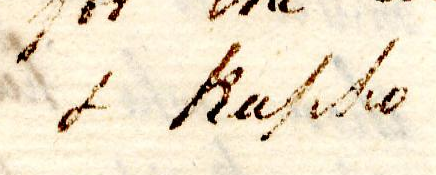& Rapho
